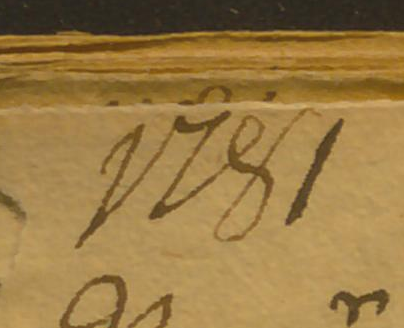1781
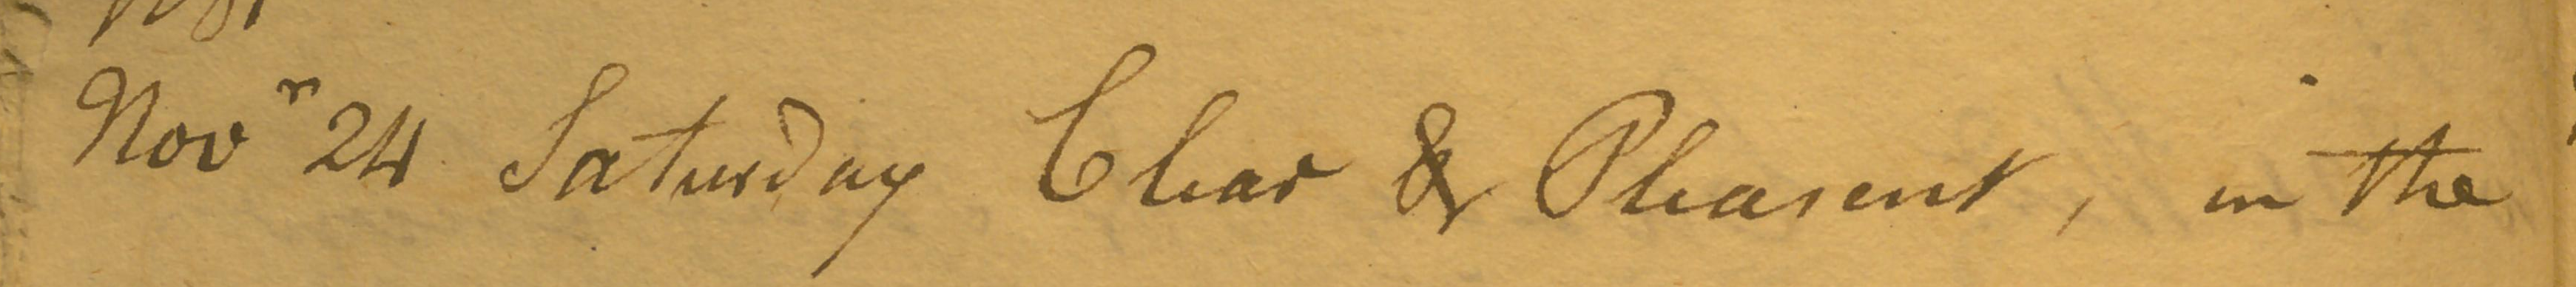Nov^r 24 Saturday Clear & Pleasent, in the
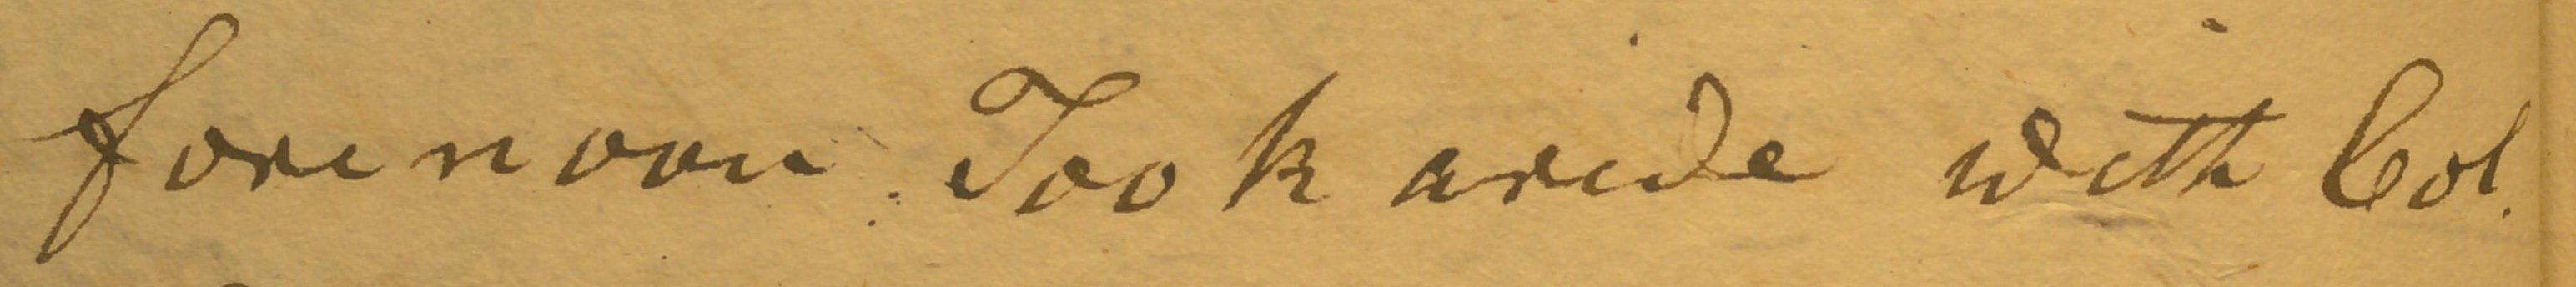forenoon Took a ride with Col
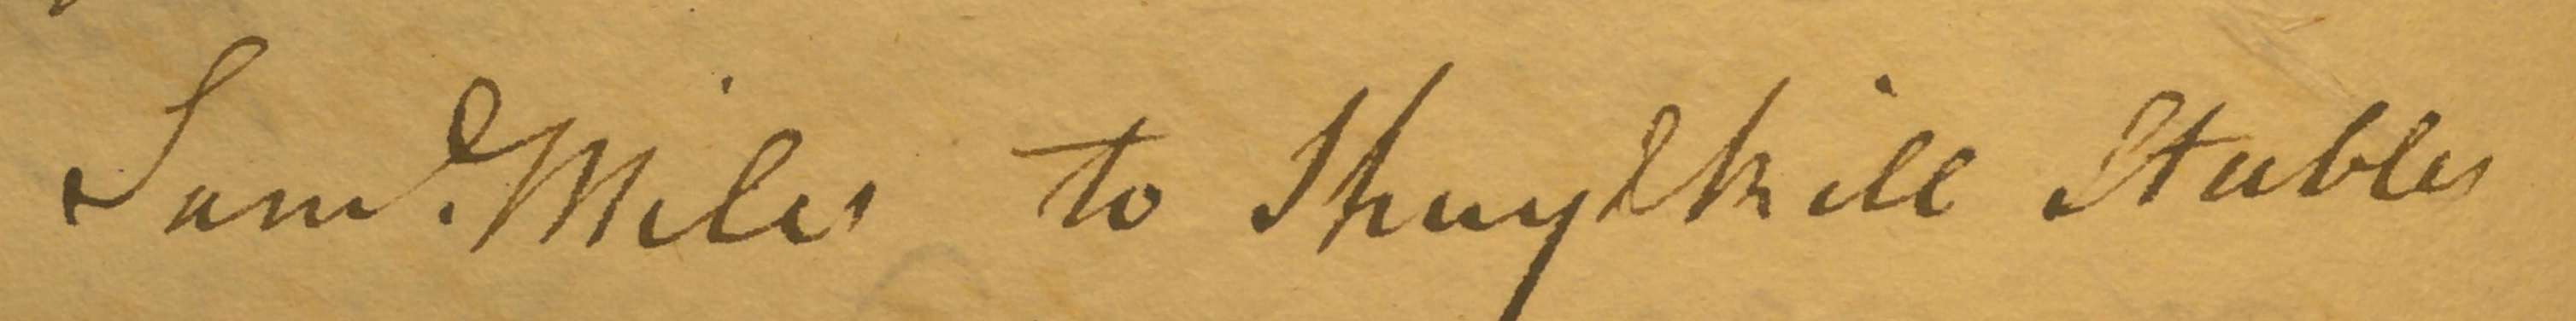Sam^l. Miles to Shuylkill Stables
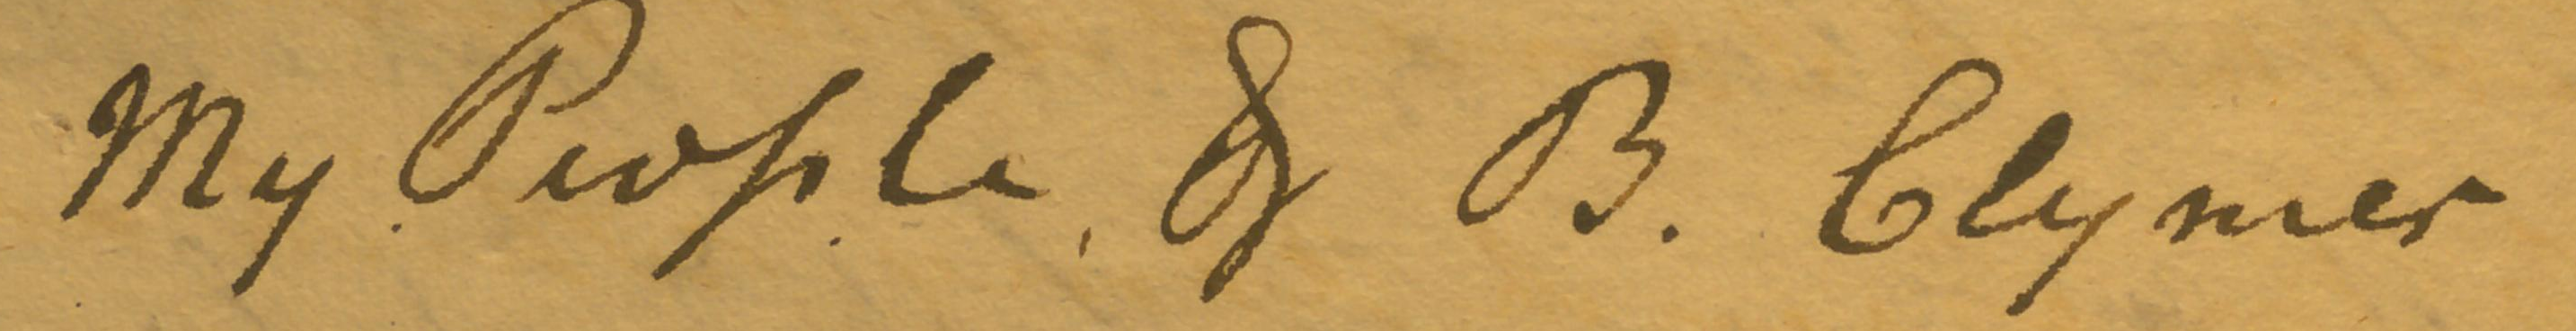My People & B. Clymer
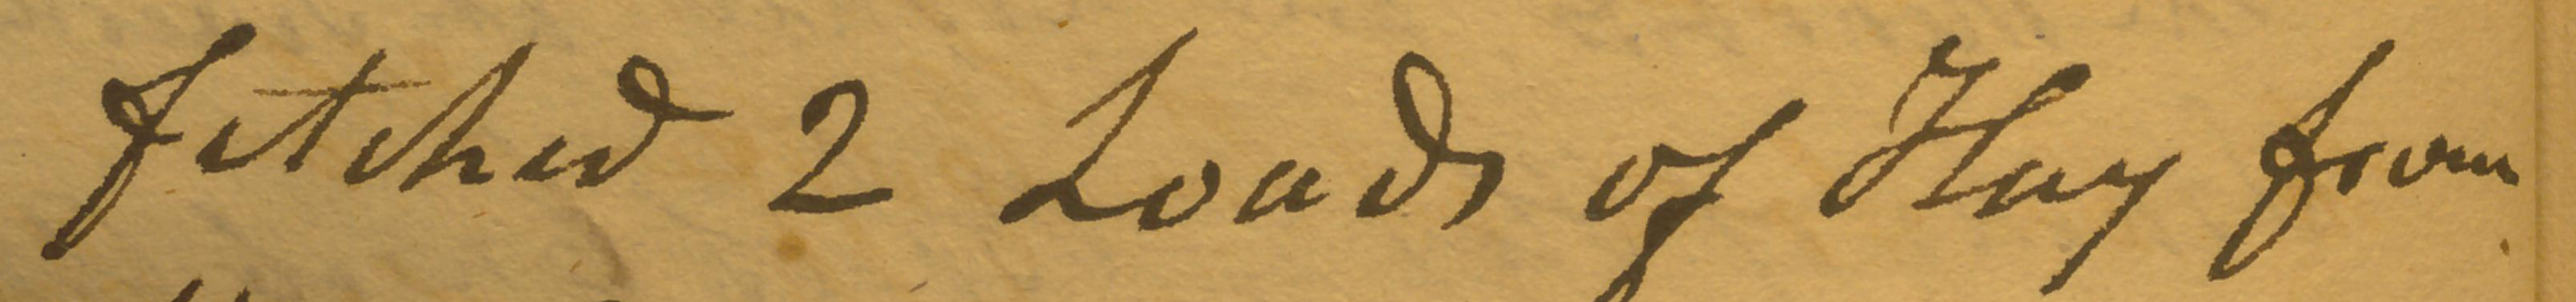fetched 2 Loads of Hay from
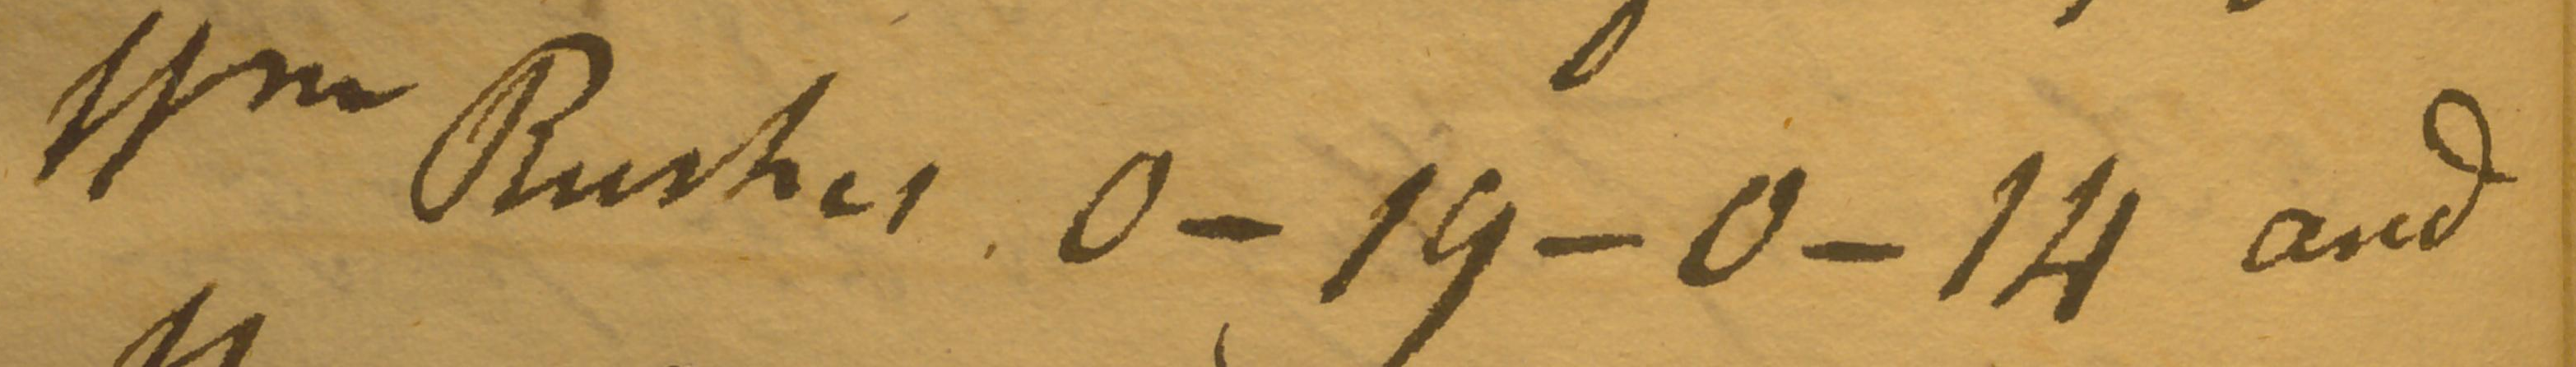W^m. Ruches. 0-19-0-14 and
